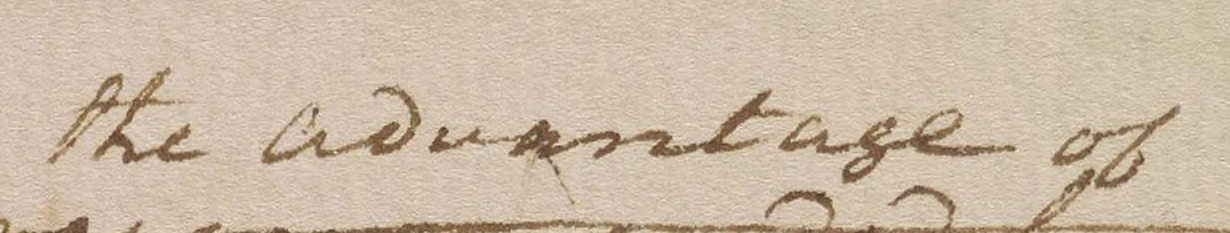the advantage of
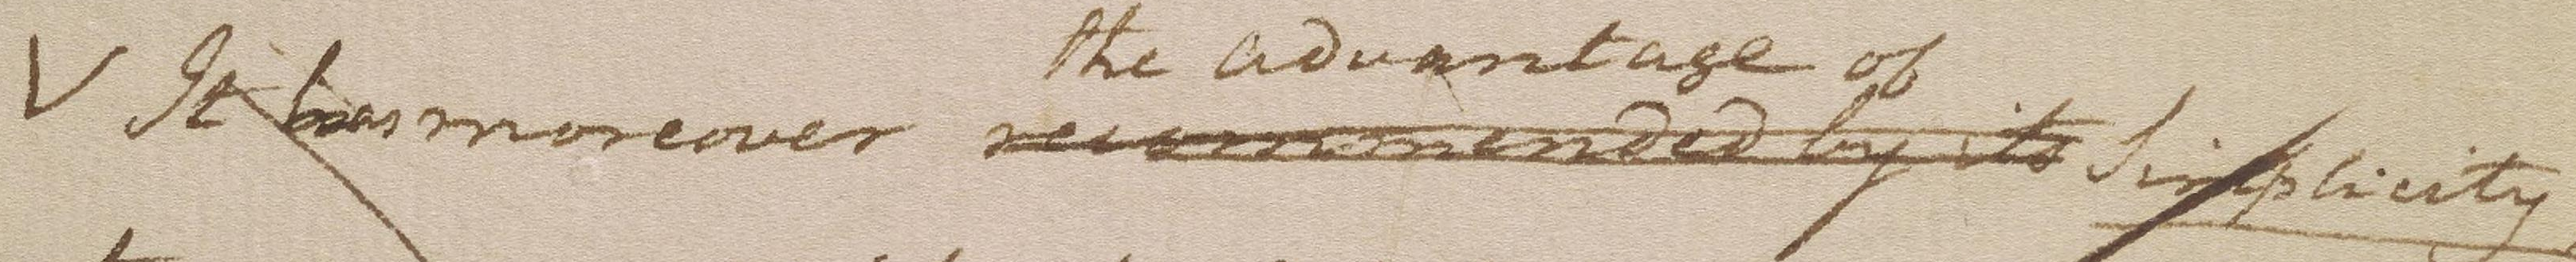V It has moreover [recommended by its] Simplicity,
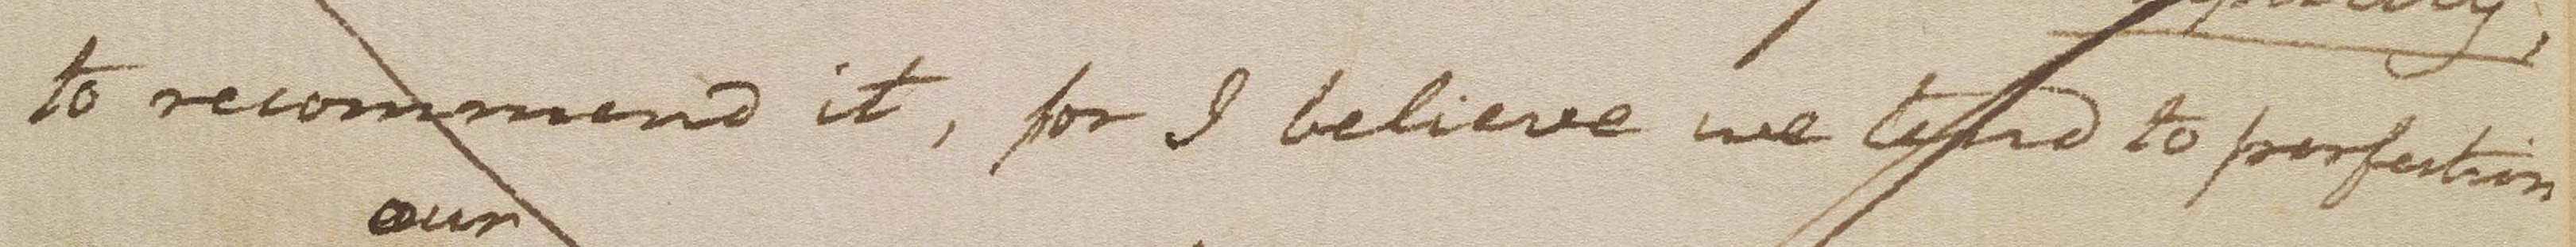to recommnd it, for I believe we tend to perfection
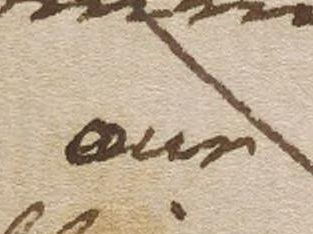our
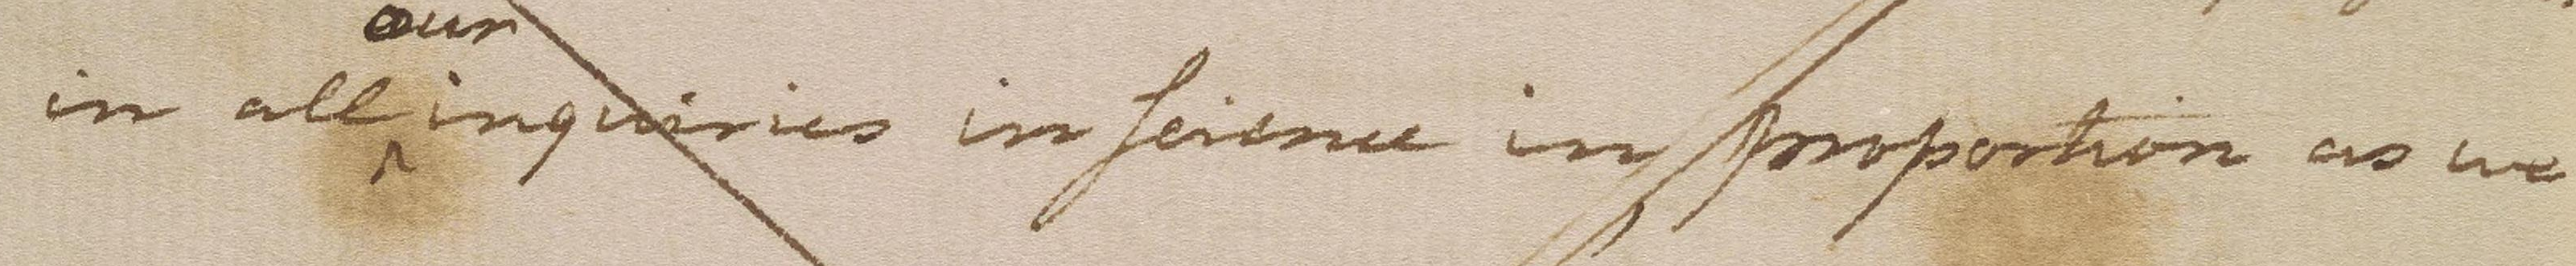in all ^ inquiries in Science in proportion as we
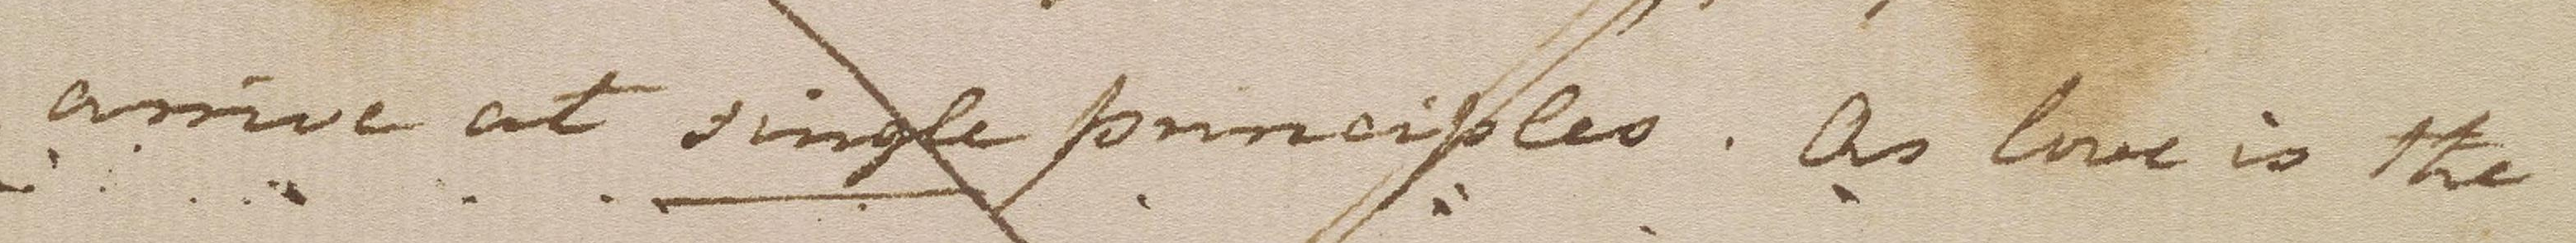arrive at single principles as love is the
